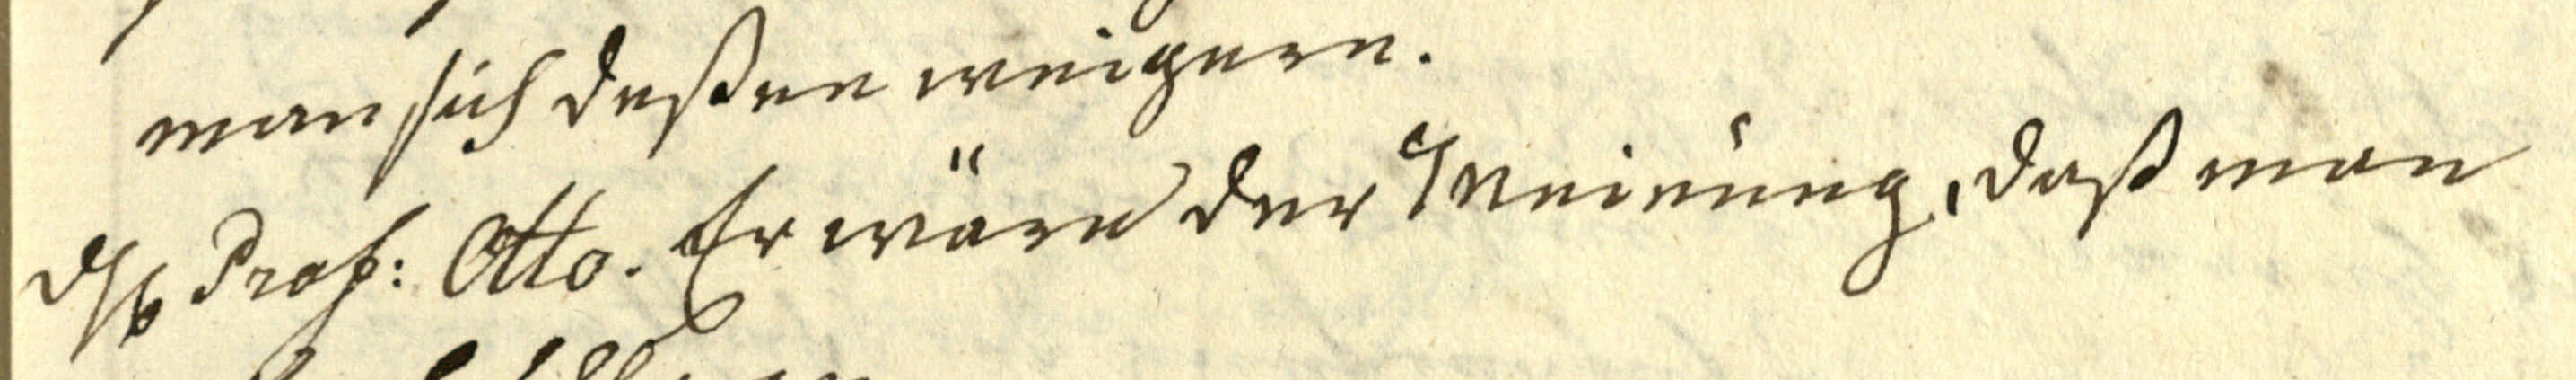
dh Prof. Otto. Er wäre der Meinung, daß man
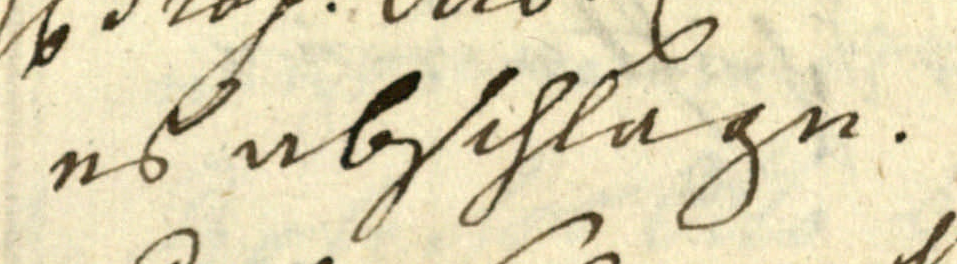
es abschlage.
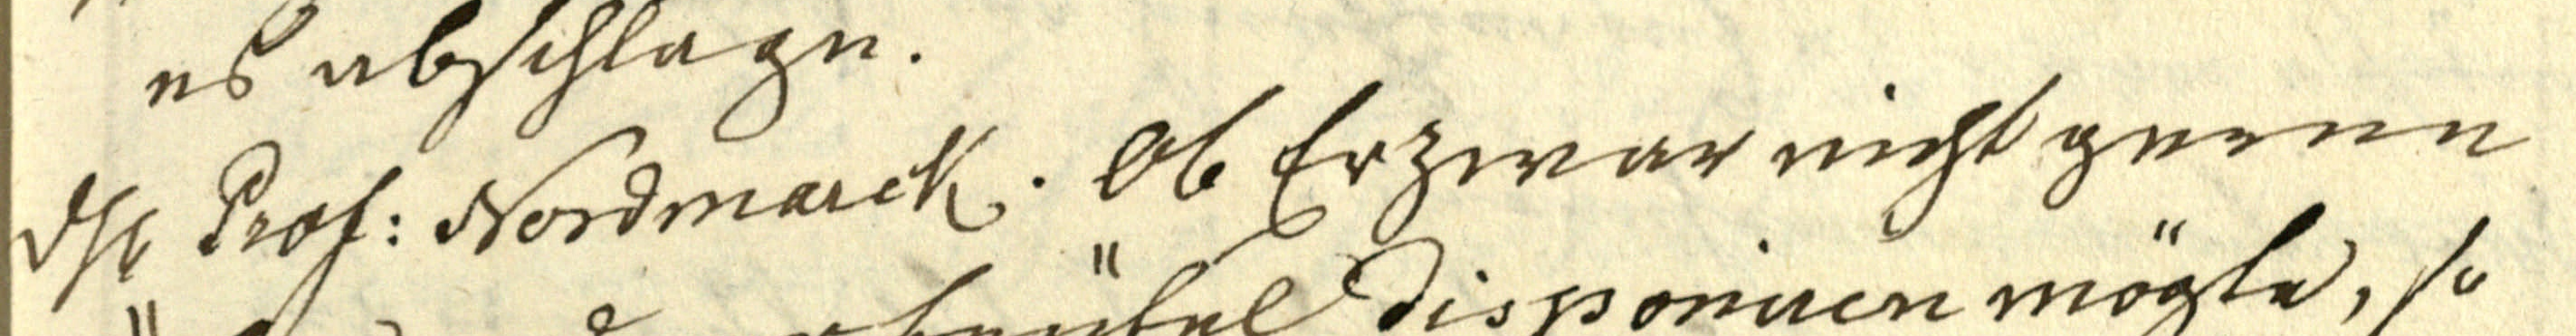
dh Prof. Nordmarck Ob. Er zwar nicht gerne
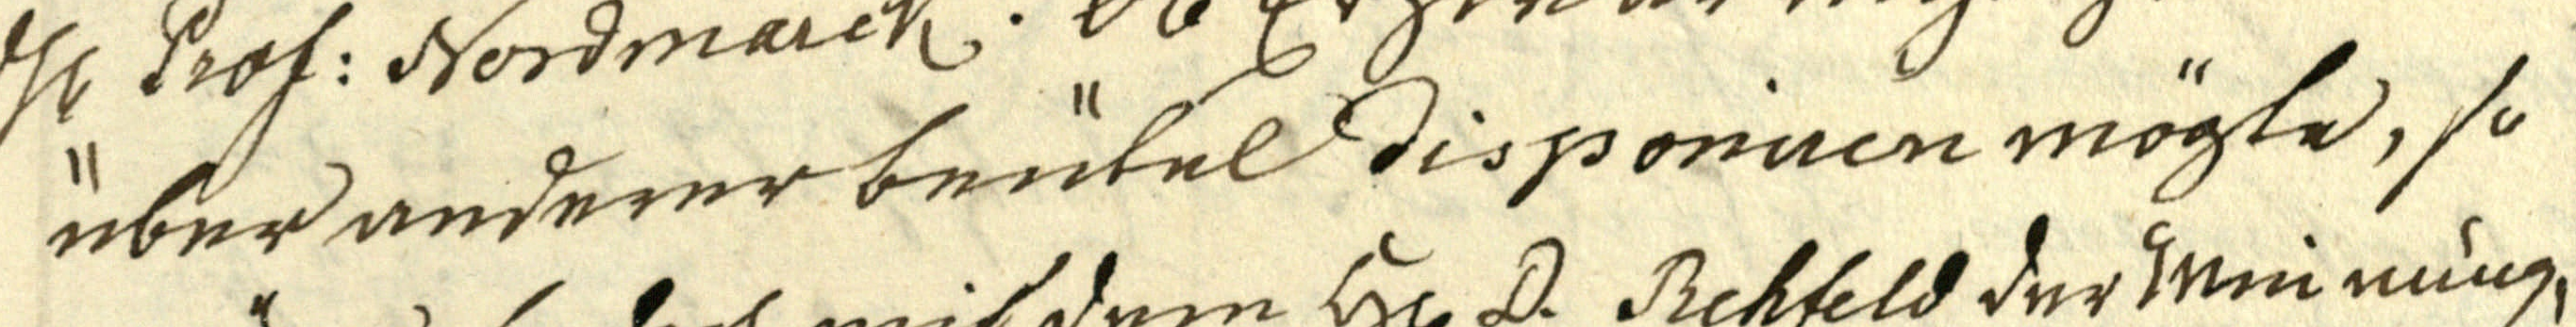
über anderer Beutel disponiren mögte, so
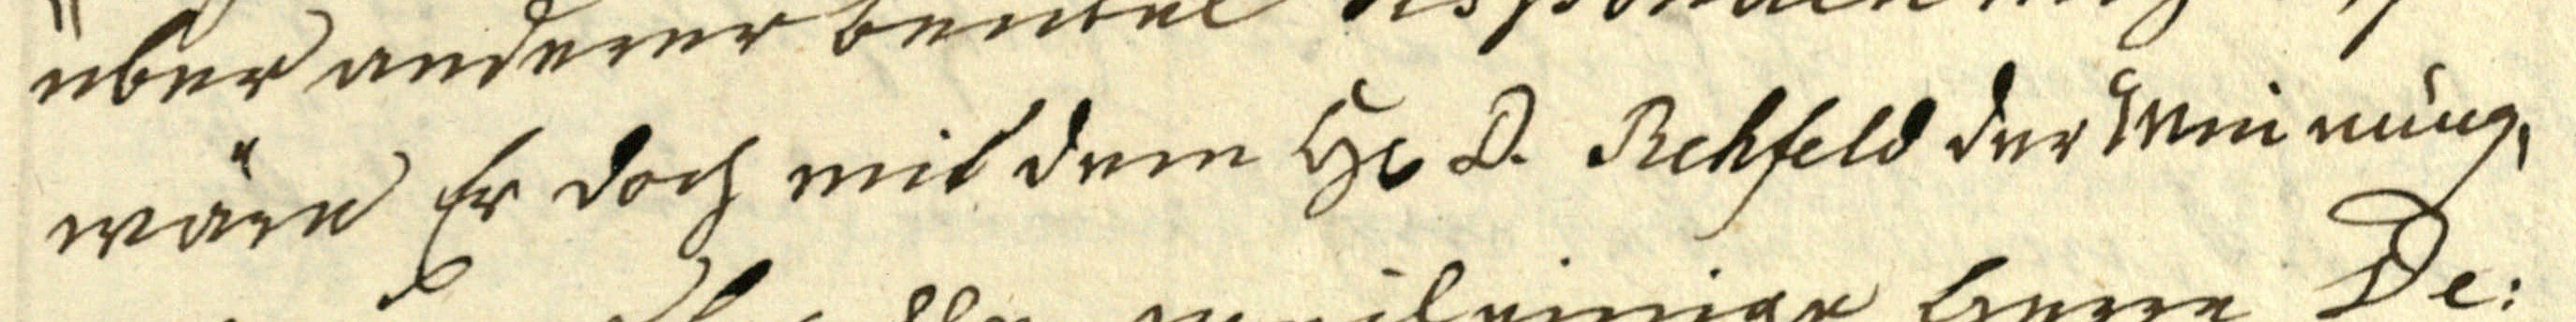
wäre Er doch mit dem H D. Rehfeld der Meinung,
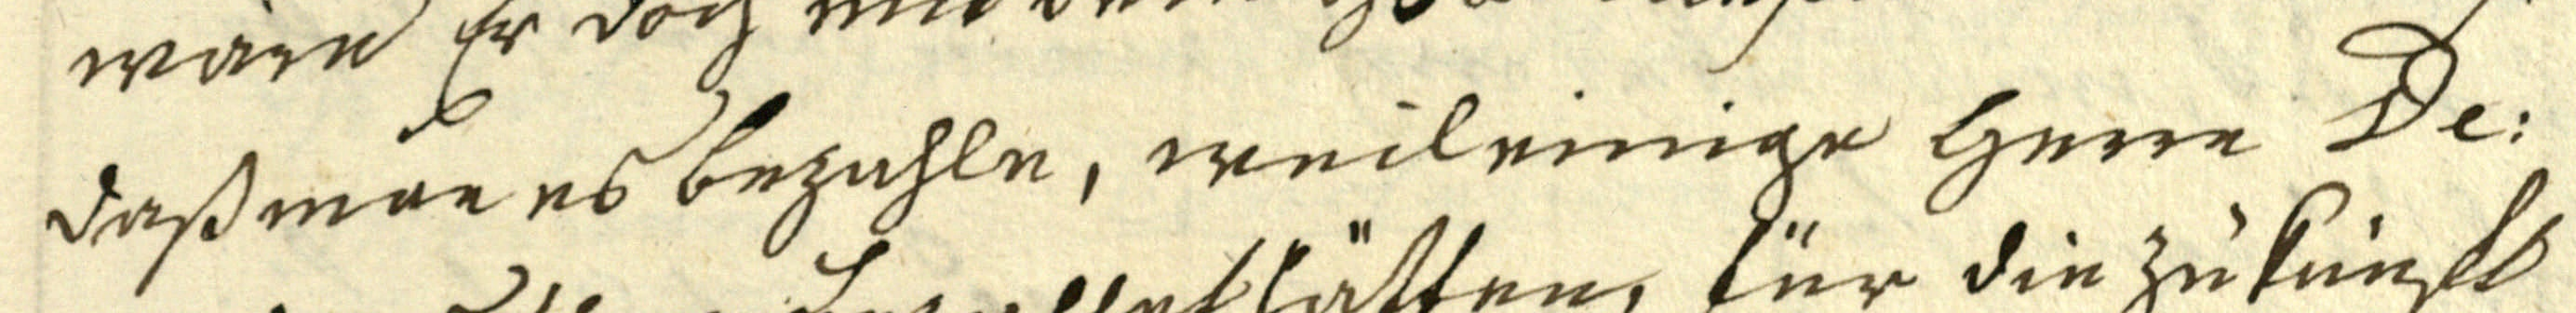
daß man es bezahle, weil einige Herrn De¬
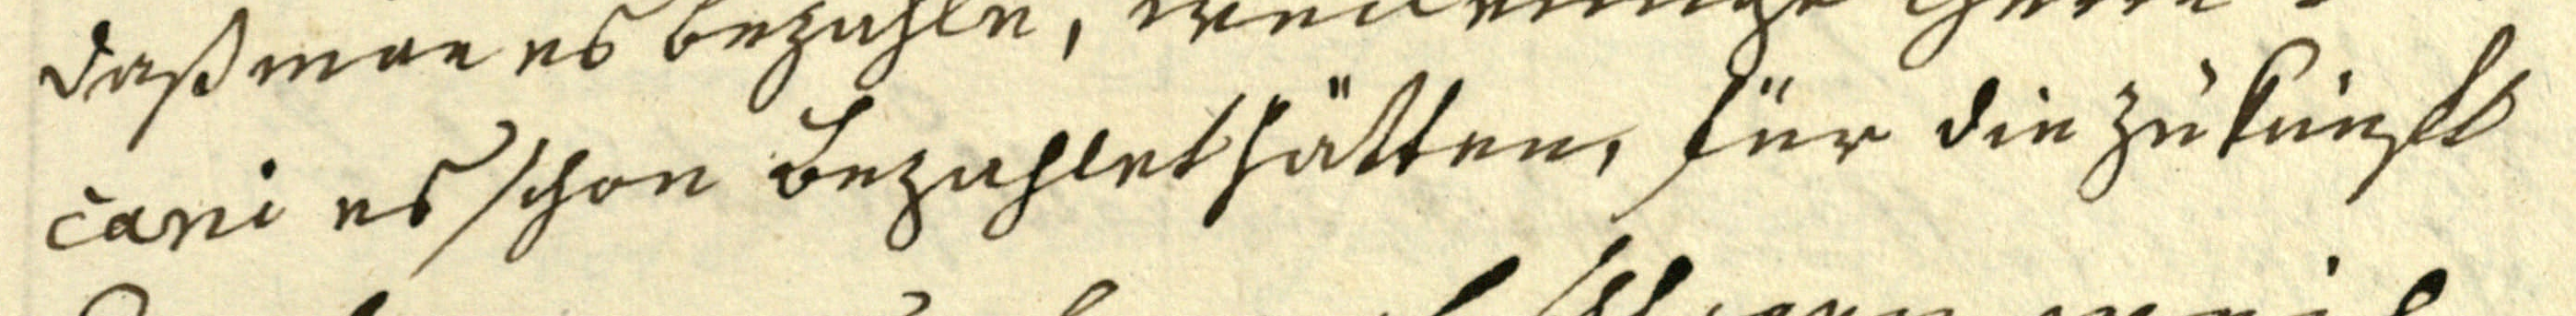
cani es schon bezahlet hätten, für die Zukunft
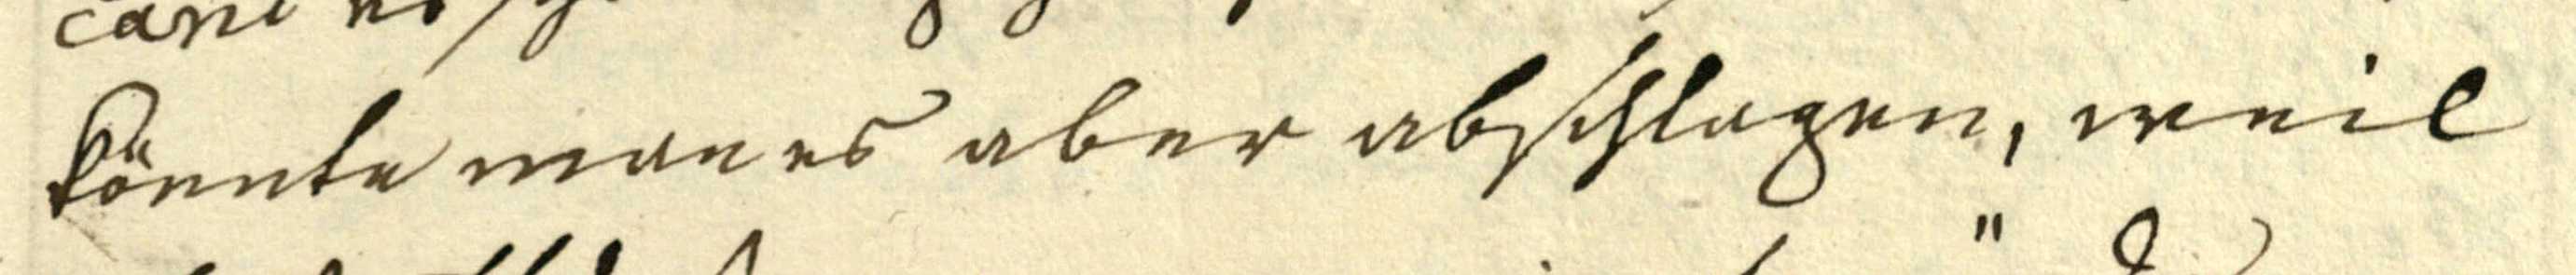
könnte man es aber abschlagen, weil
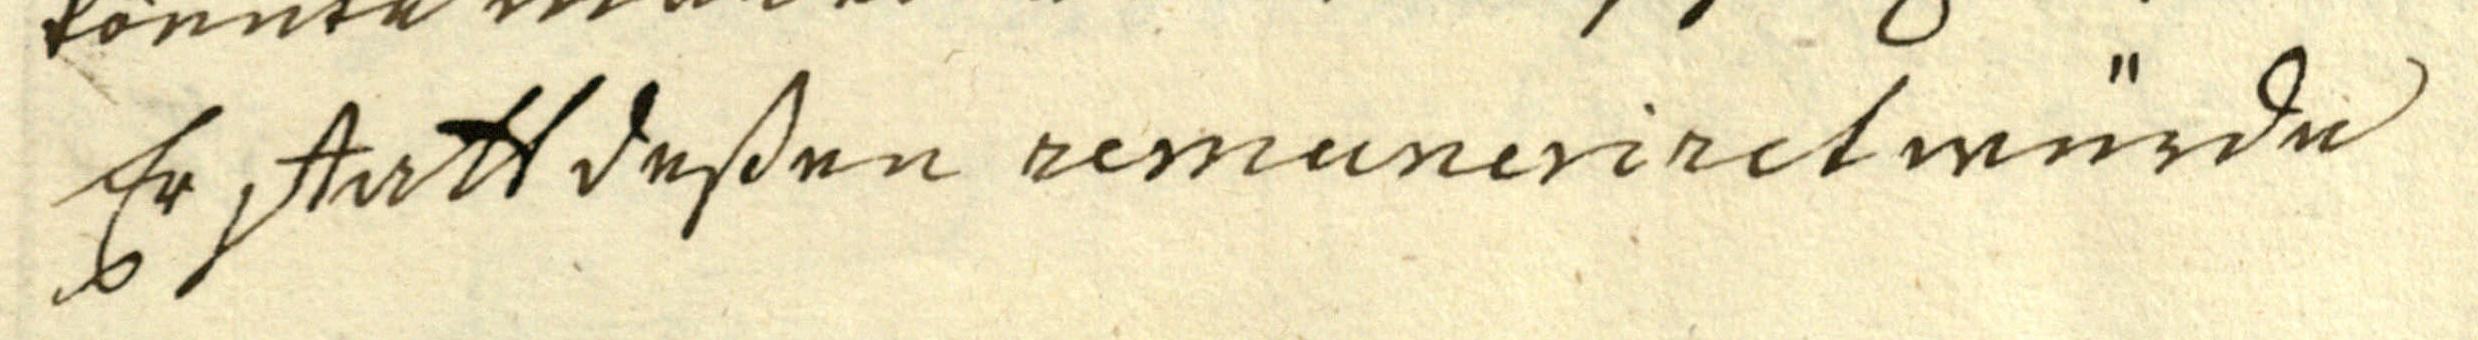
Er statt deßen remuneriret würde.
